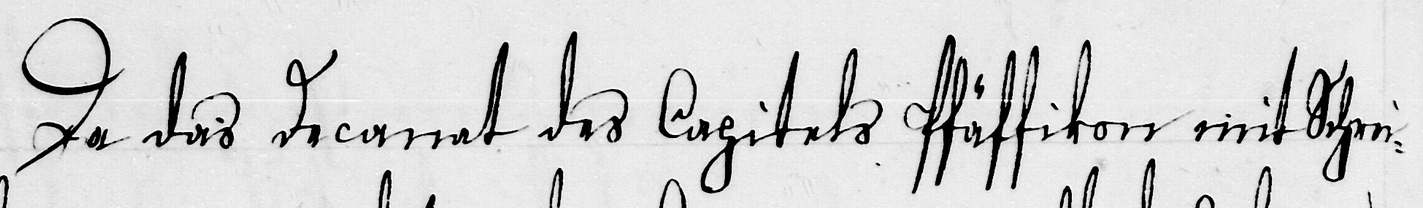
Da das Decanat des Capitels Pfäffikon mit Sch¬
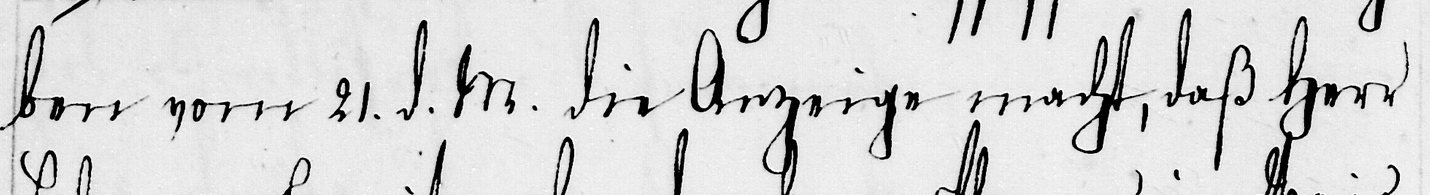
ben vom 21. d. M. die Anzeige macht, daß Herr
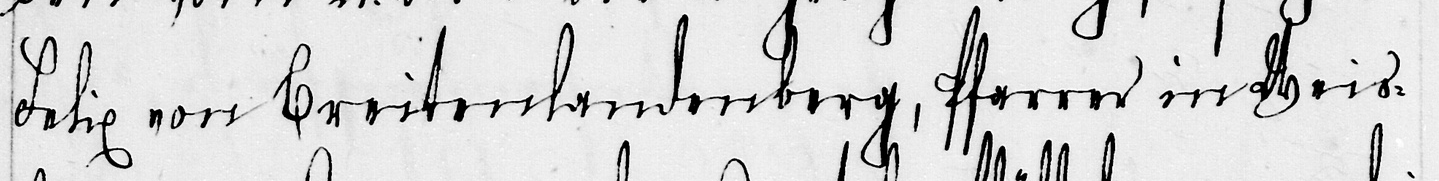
Felix von Breitenlandenberg, Pfarrer in Weis¬
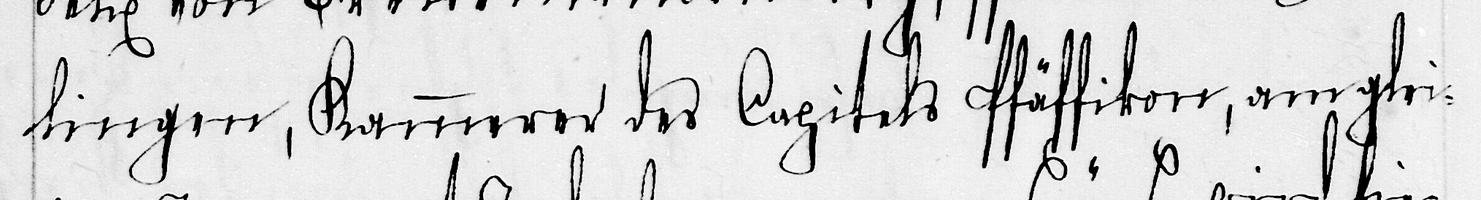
lingen, Kammerer des Capitels Pfäffikon, am glei¬
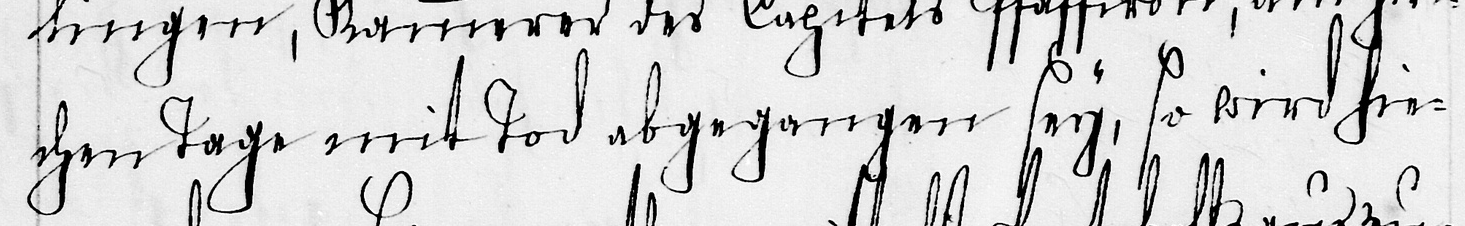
chen Tage mit Tod abgegangen sey, so wird hie¬
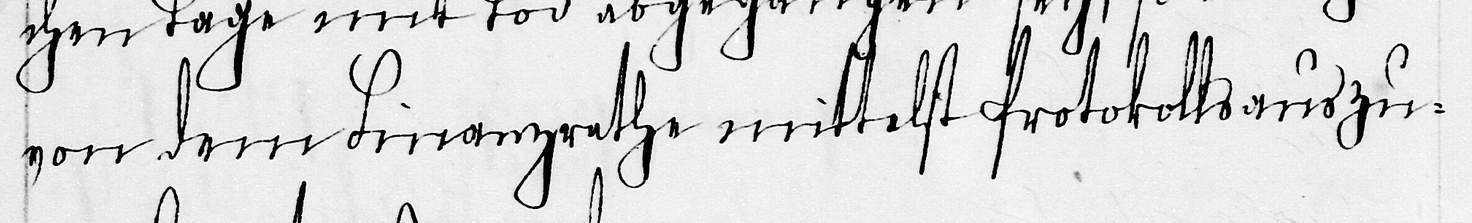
von dem Finanzrathe mittelst Protokollsauszu¬
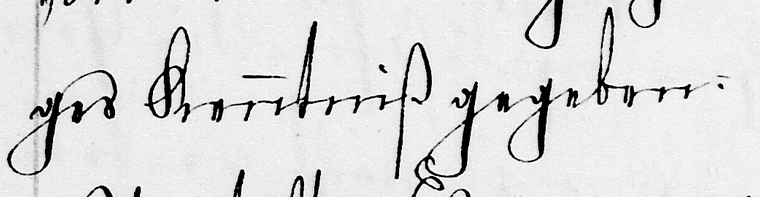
ges Kenntniß gegeben.
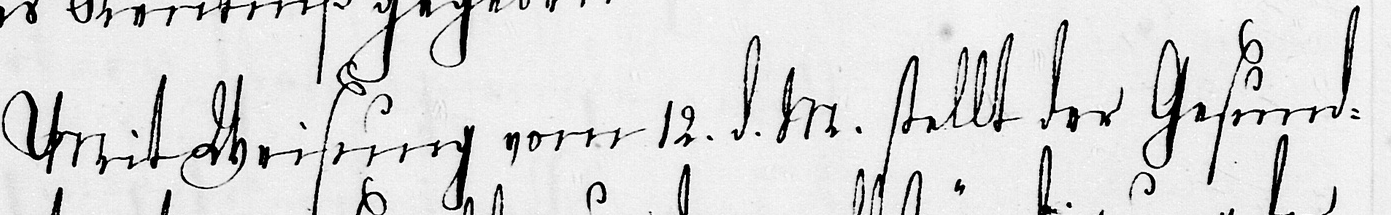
Mit Weisung vom 12. d. M. stellt der Gesund¬
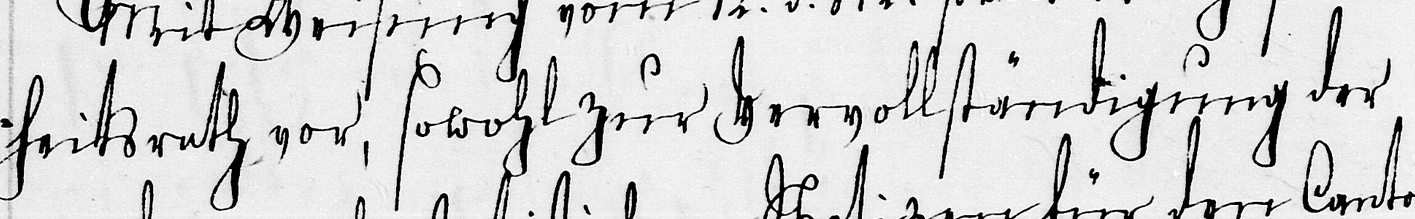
heitsrath vor, sowohl zur Vervollständigung der
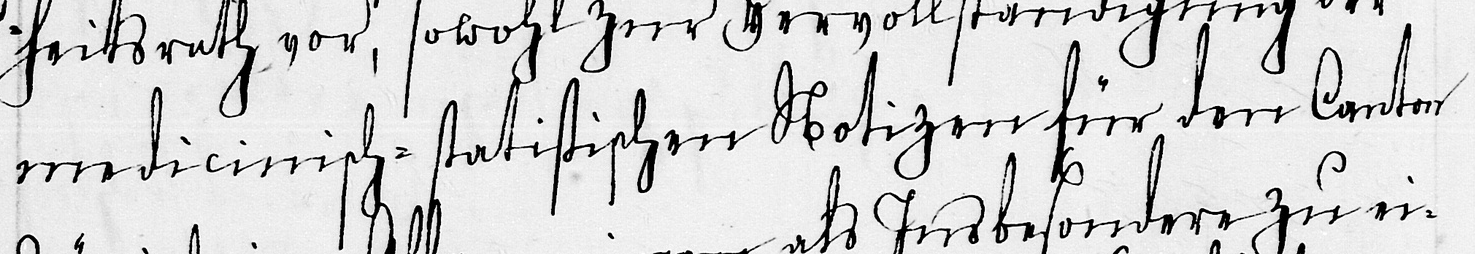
medicinisch-statistischen Notizen für den Canton
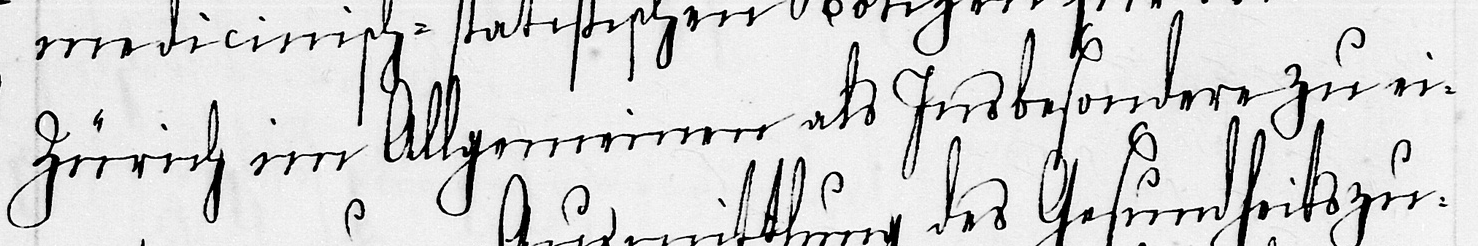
Zürich im Allgemeinen als Insbesondere zu ei¬
